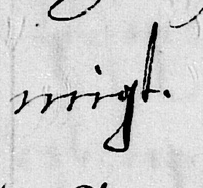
migt.
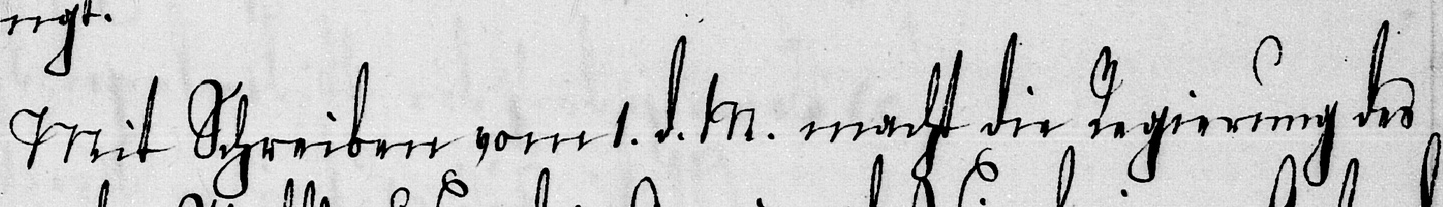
Mit Schreiben vom 1. d. M. macht die Regierung des
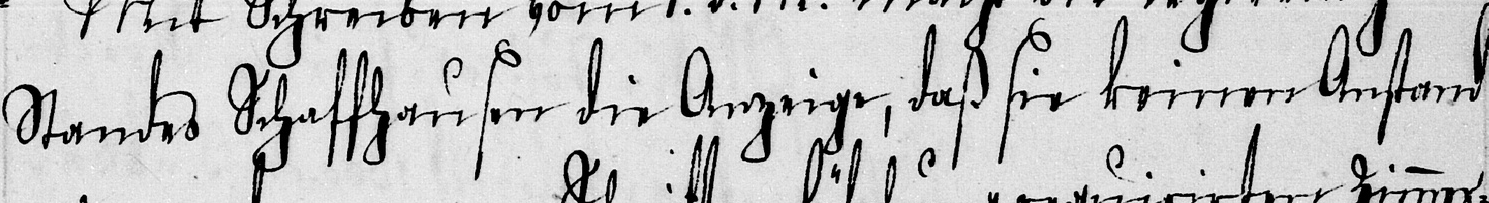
Standes Schaffhausen die Anzeige, daß sie keinen Anstand
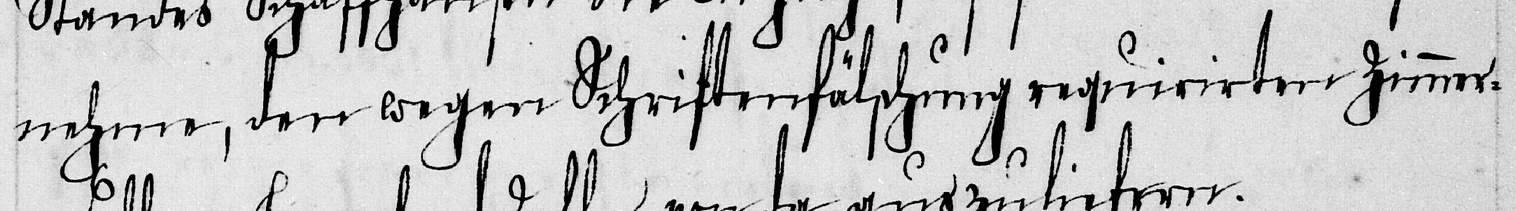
nehme, den wegen Schriftenfälschung requirirten Zimmer¬
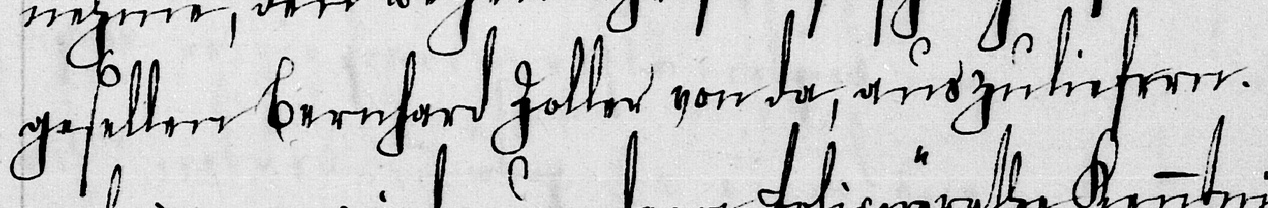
gesellen Bernhard Zoller von da, auszuliefern.
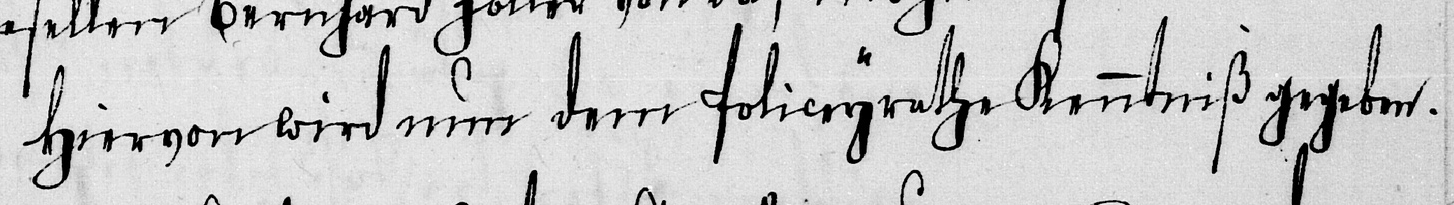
Hiervon wird nun dem Policeyrathe Kenntniß gegeben.
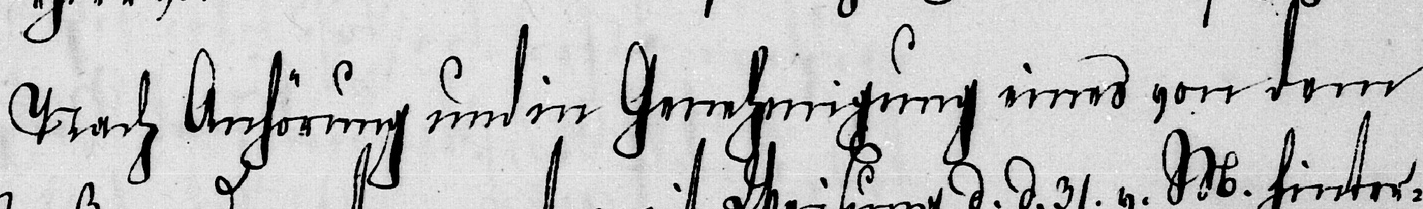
Nach Anhörung und in Genehmigung eines von dem
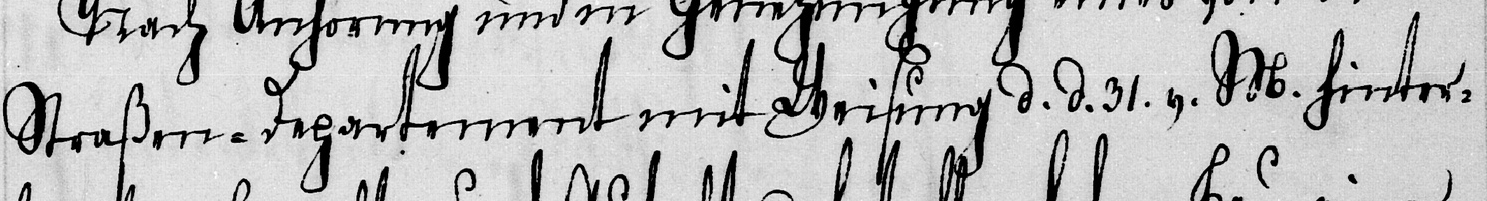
Straßen-Departement mit Weisung d. d. 31. v. M. hinter¬
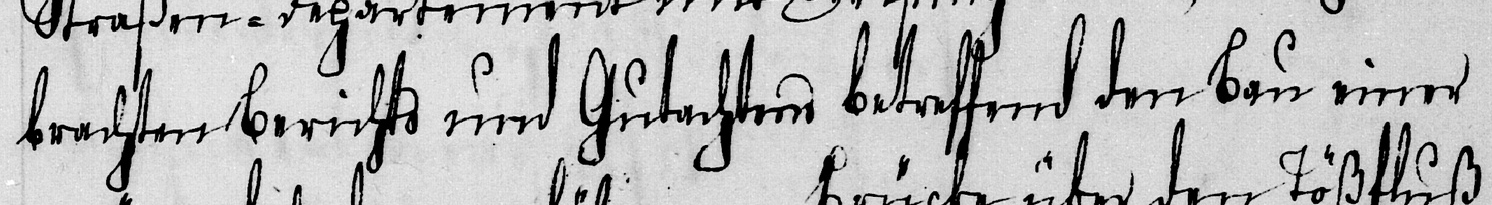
brachten Berichts und Gutachtens betreffend den Bau einer
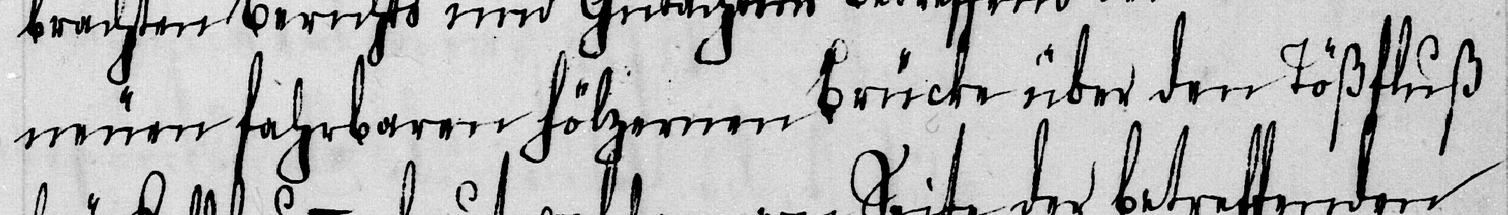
neuen fahrbaren hölzernen Brücke über den Tößfluß
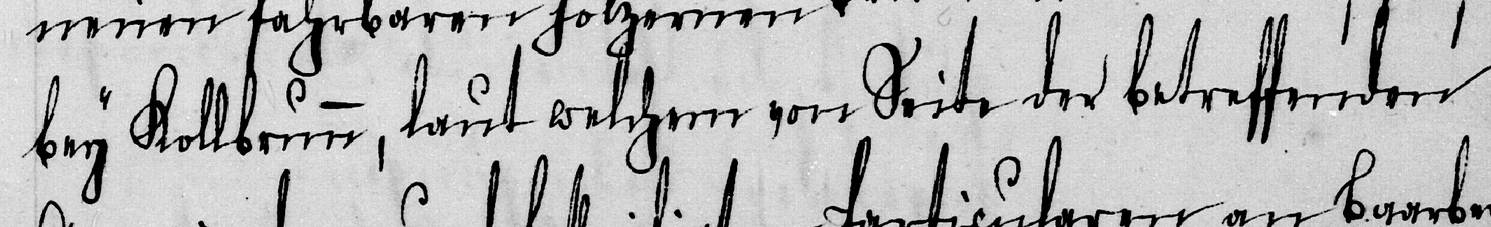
bey Kollbrunn, laut welchem von Seite der betreffenden
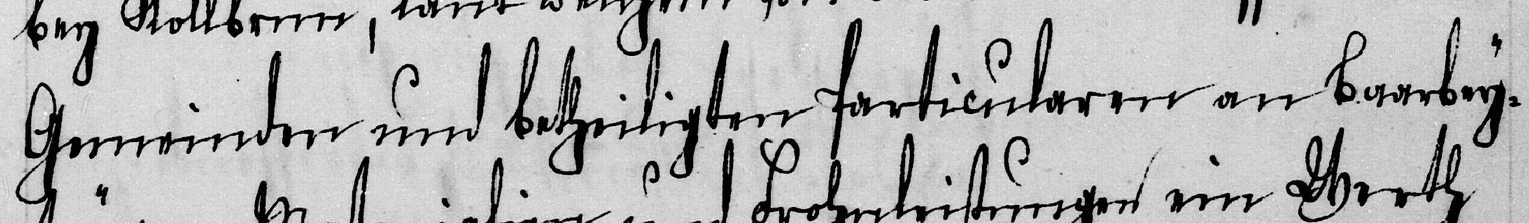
Gemeinden und betheiligten Particularen an Baarbey¬
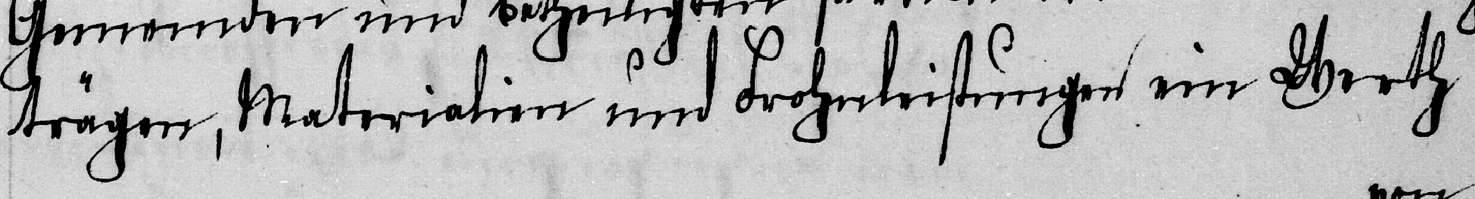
trägen, Materialien und Frohnleistungen ein Werth
